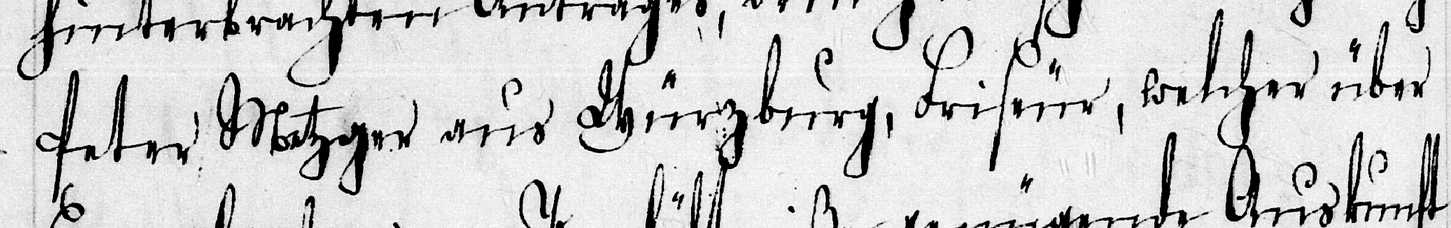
Peter Metzger aus Würzburg, Friseur, welcher über
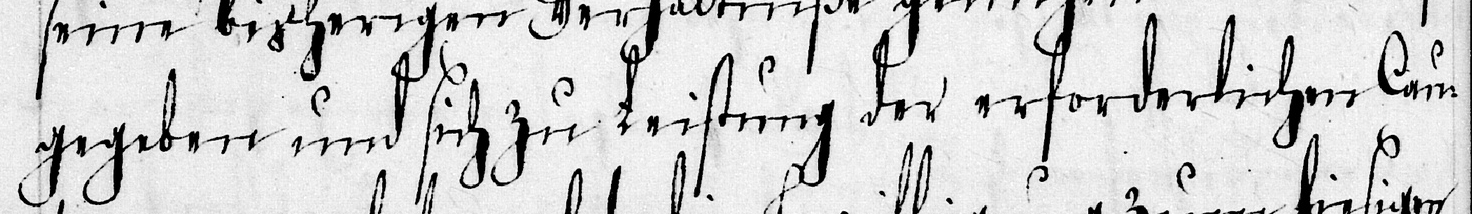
gegeben und sich zu Leistung der erforderlichen Cau¬
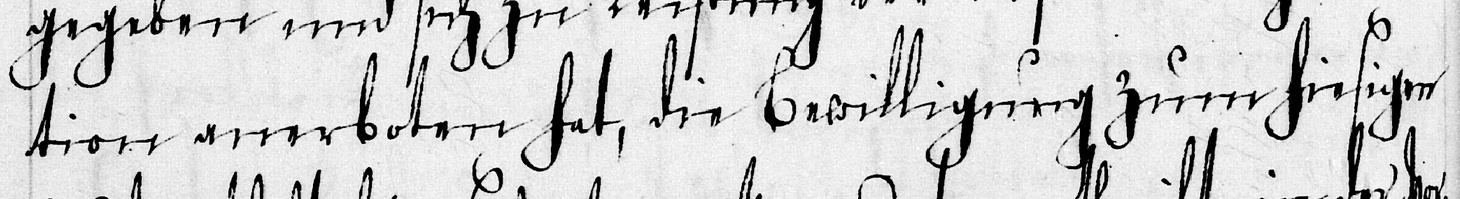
tion anerboten hat, die Bewilligung zum hiesigen
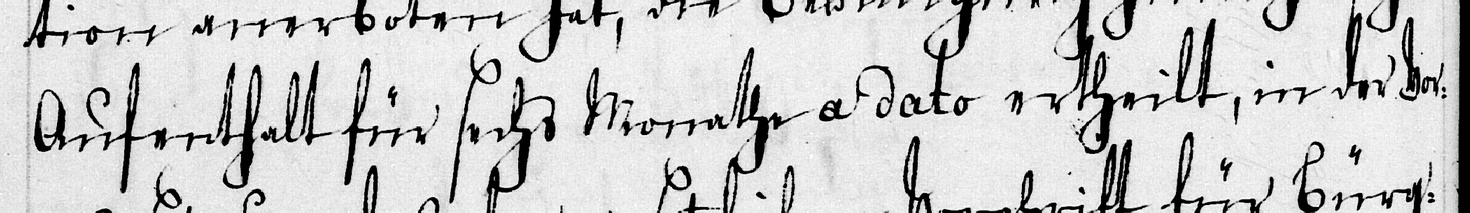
Aufenthalt für sechs Monathe a dato ertheilt, in der Vo¬
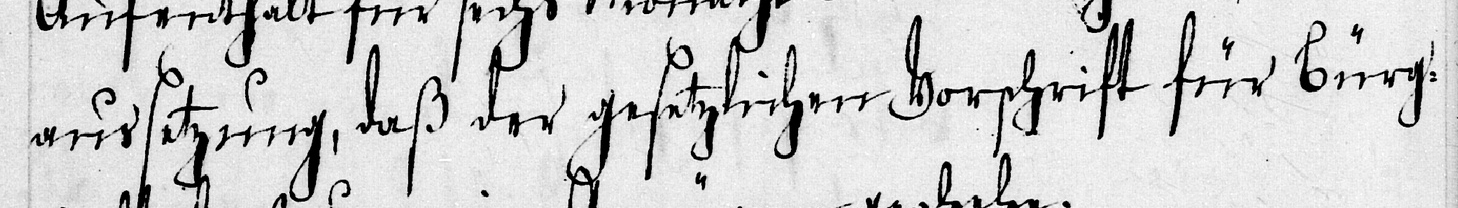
raussetzung, daß der gesetzlichen Vorschrift für Bürg¬
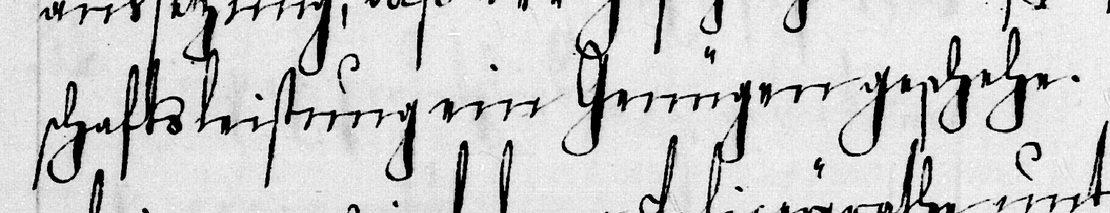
schaftsleistung ein Genügen geschehe.
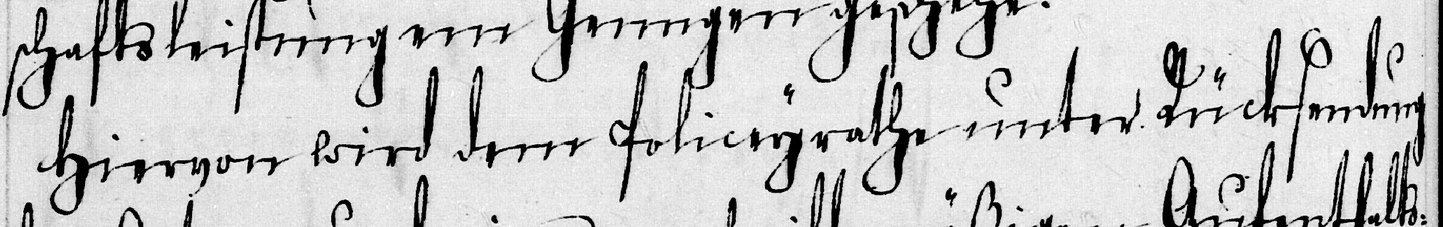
Hiervon wird dem Policeyrathe unter Rücksendung
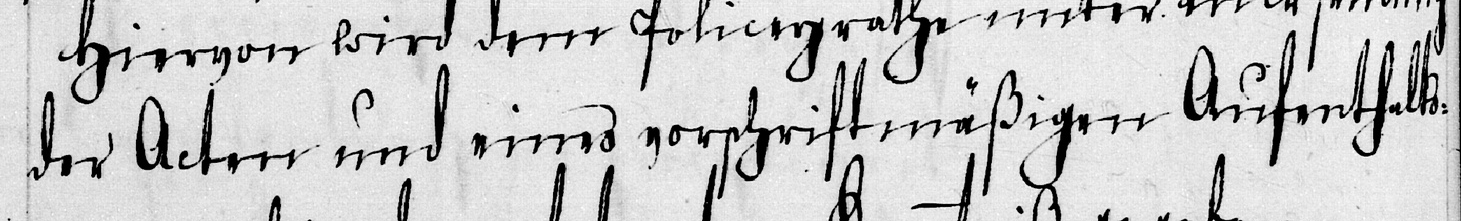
der Acten und eines vorschriftmäßigen Aufenthalts¬
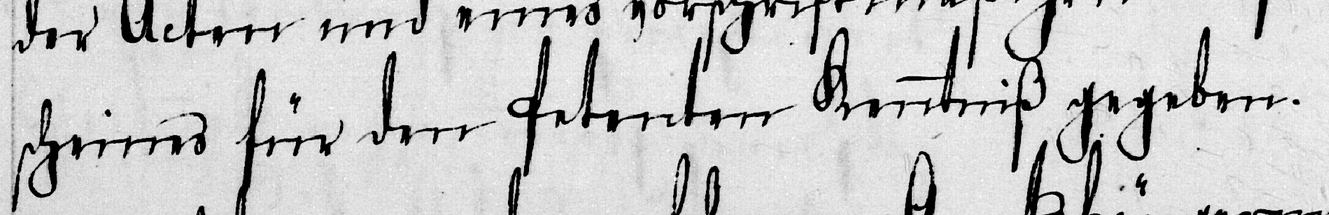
scheines für den Petenten Kenntniß gegeben.
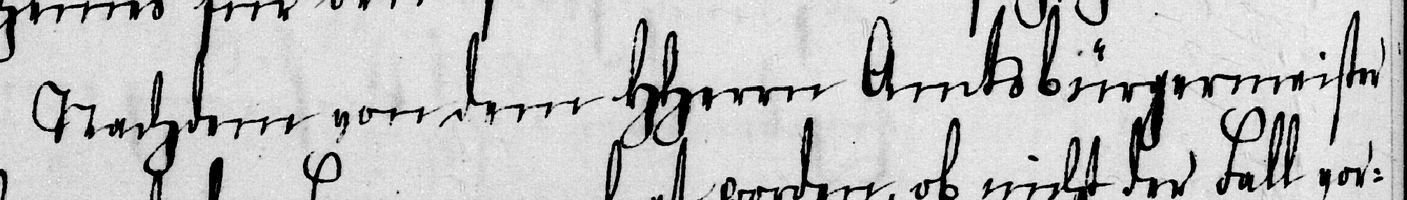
Nachdem von dem HHerrn Amtsbürgermeister
